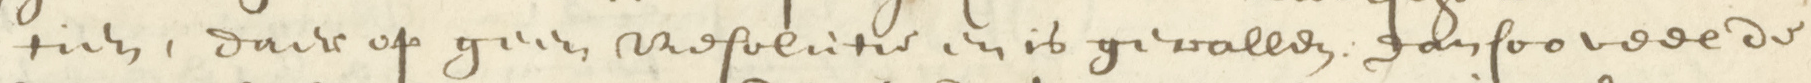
tien, daer op geen resolutie en is gevallen: dan soo veel de
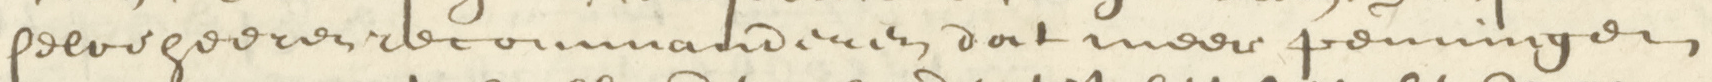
selve heeren recommanderen dat meer penningen
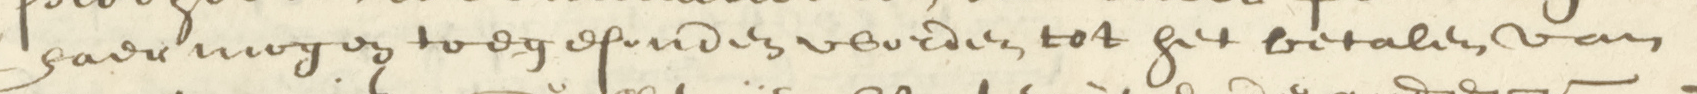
haer mogen toegesonden worden tot het betalen van
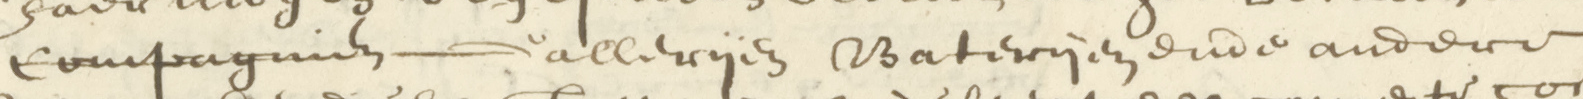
Compagnien Gallerijen, Baterijen ende andere
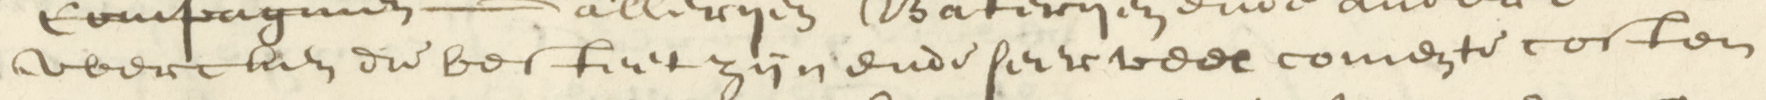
wercken die besteet zijn ende seer veel comen te costen
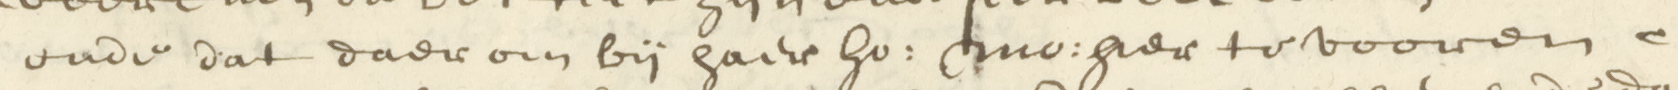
ende dat daer om bij haer ho:mo: te vooren
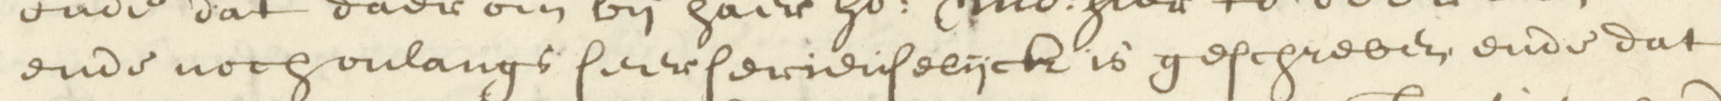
ende noch onlangs seer serieuselijck is geschreven ende dat
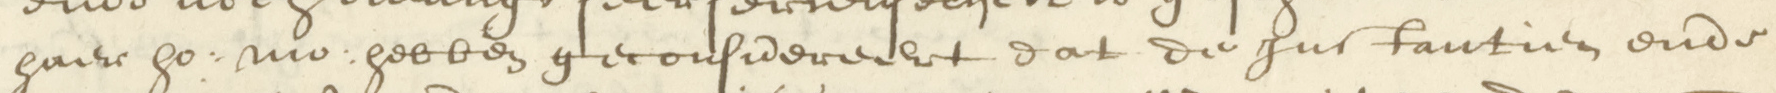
haer ho:mo: hebben geconsidereert dat de instantien ende
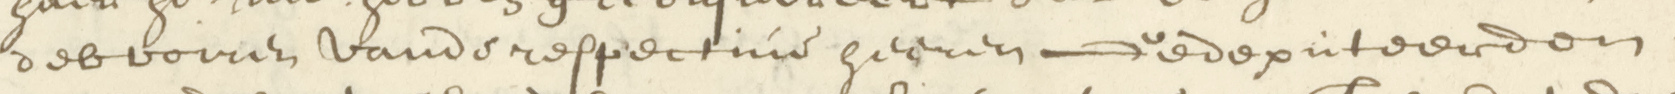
debvoiren vande respectiue heeren Gedeputeerden
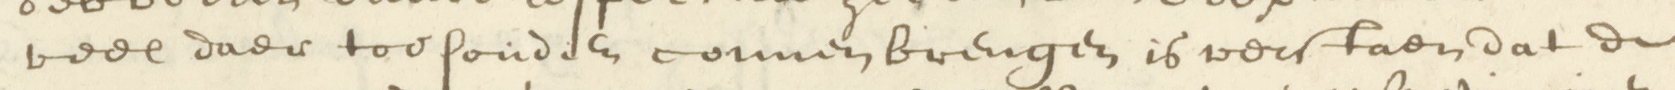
veel daer toe souden connen brengen is verstaen dat de
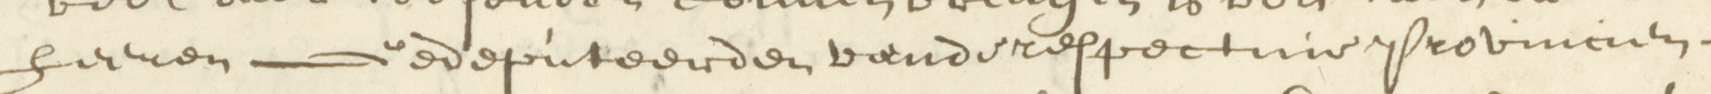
heeren Gedeputeerden vande respectiue provincien
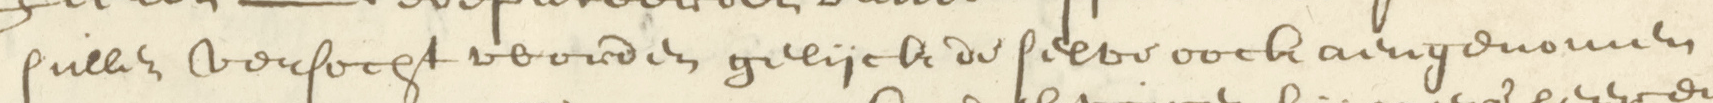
sullen versocht worden gelijck de selve oock aengenomen
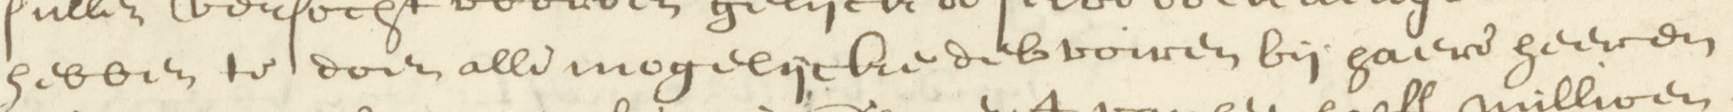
hebben te doen alle mogelijcke debvoiren bij haere heeren
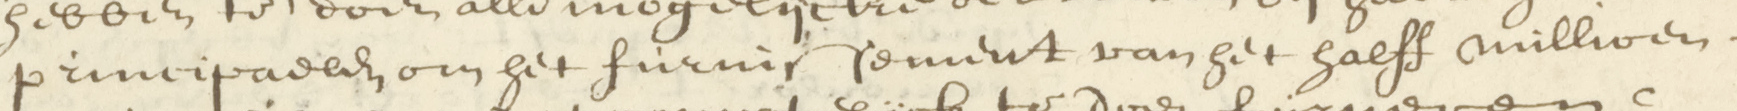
principaelen om het furnissement van het halff millioen
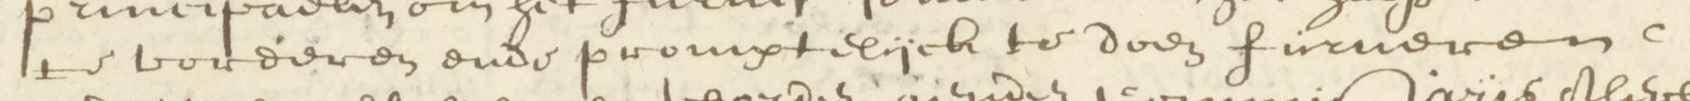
te vorderen ende promptelijck te doen furneren
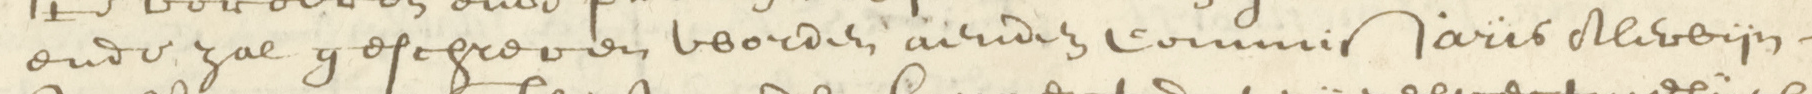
ende zal geschreven worden aenden Commissaris Alewijn
